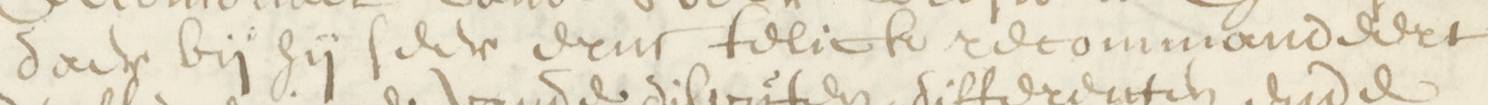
daer bij hij seer ernstelick recommandeert
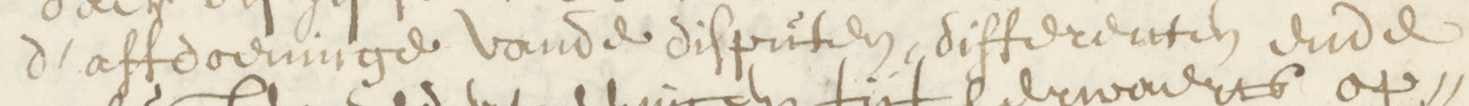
d‛affdoeninge vande disputen, differenten ende
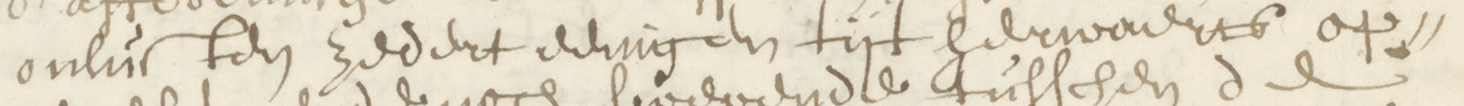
onlusten zedert eenigen tijt herwaerts op„
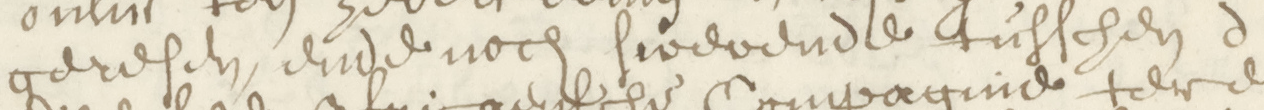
geresen, ende noch swerende tusschen de
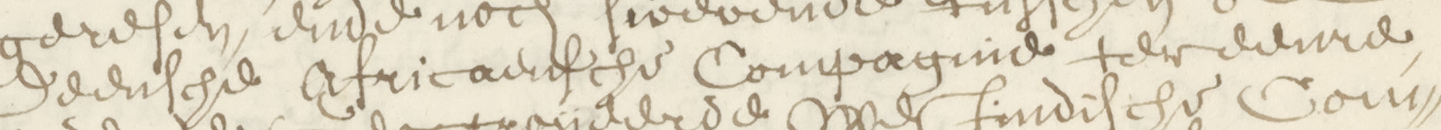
Deensche Africaensche Compagnie ter eenre
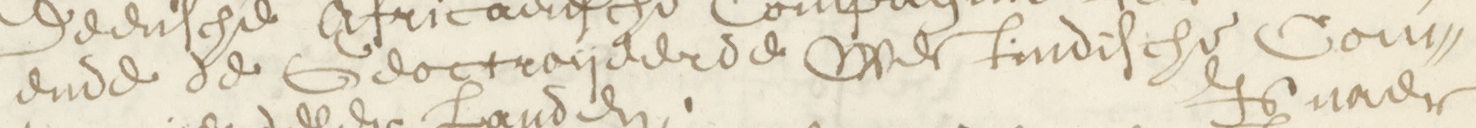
ende de Geoctroijeerde Westindische Com„
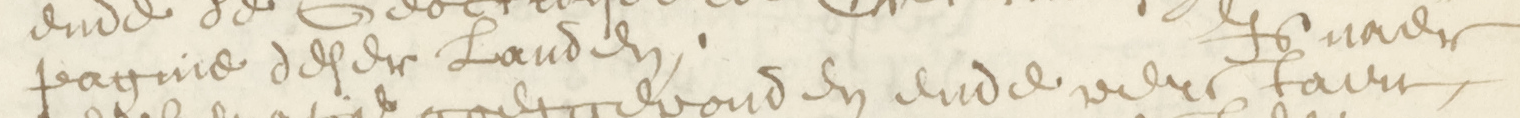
pagnie deser Landen. Is naer
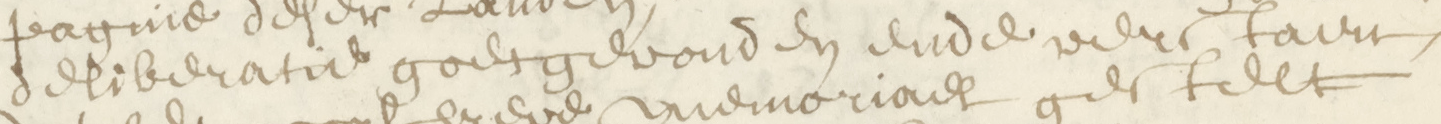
deliberatie goetgevonden ende verstaen,
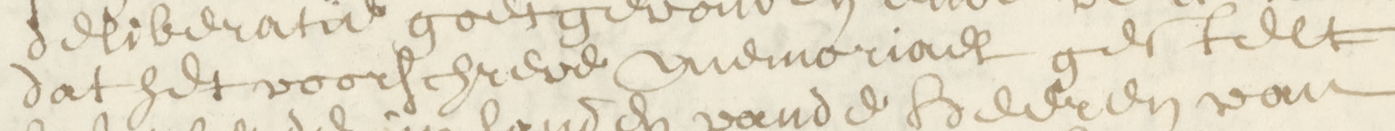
dat het voorschreve memoriael gestelt
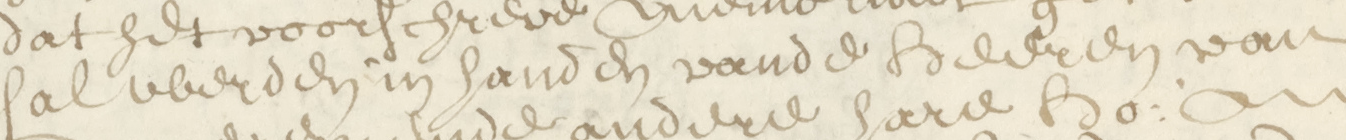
sal werden in handen vande Heeren van
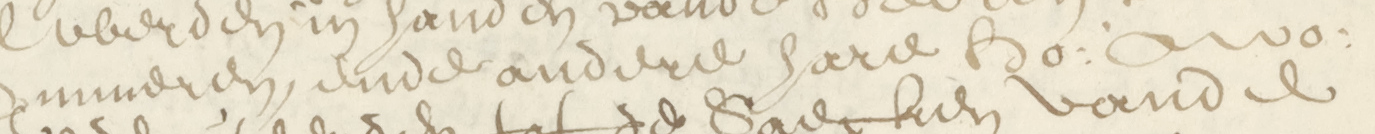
Ommeren, ende andere hare Ho:Mo:
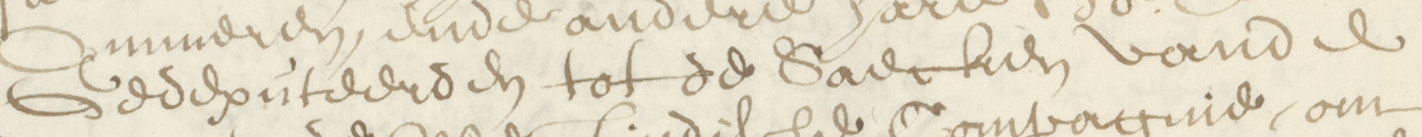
Gedeputeerden tot de Saecken vande
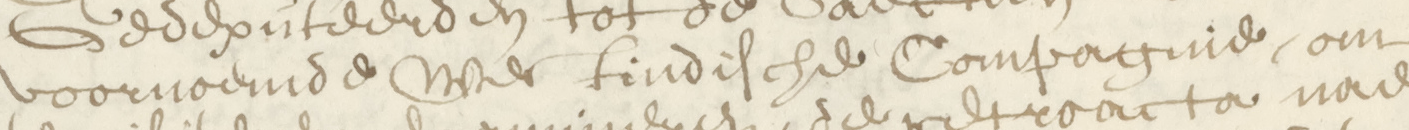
voornoemde Westindische Compagnie om
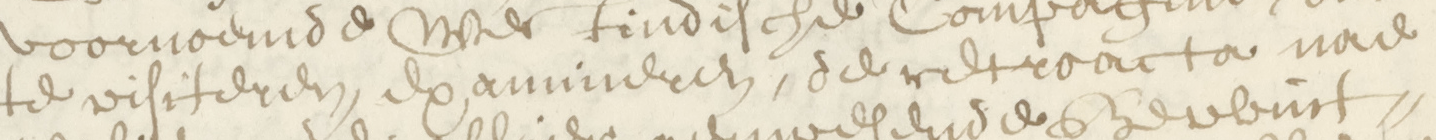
te visiteren, examineren, de retroacta nae
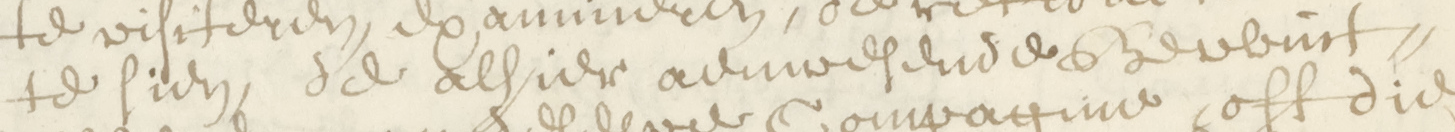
te sien, de alhier aenwesende Bewint„
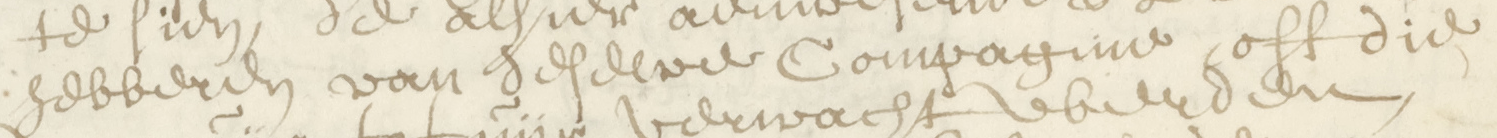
hebberen van deselve Compagnie, oft die
